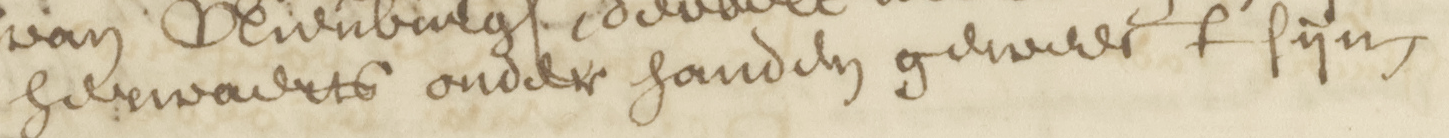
herwaerts onder handen geweest sijn,
